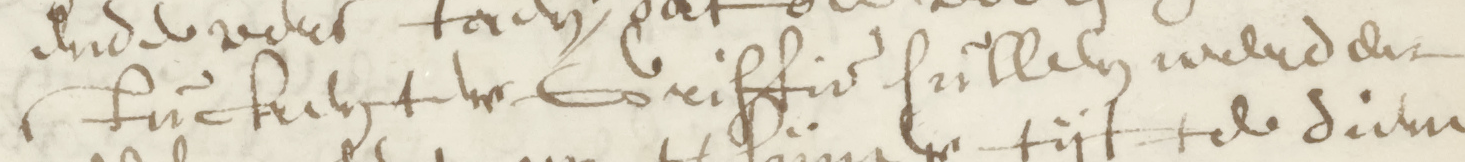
stucken ter Griffie sullen werden
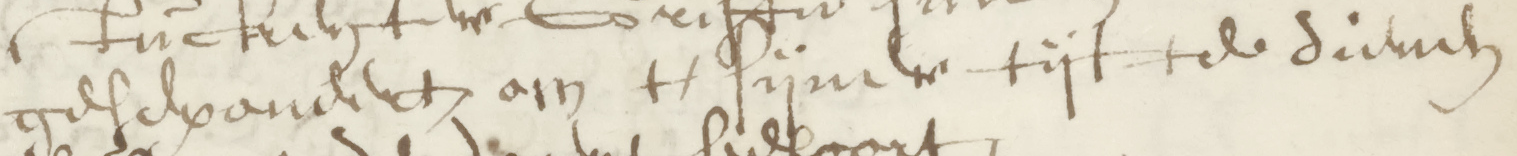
geseponeert, om t' sijner tijt te dienen
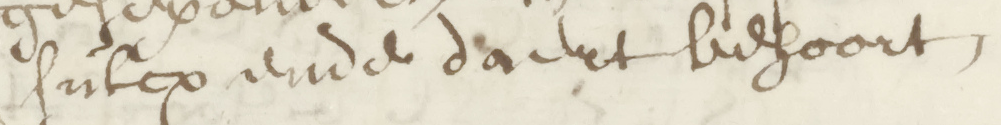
sulcx ende daert behoort.
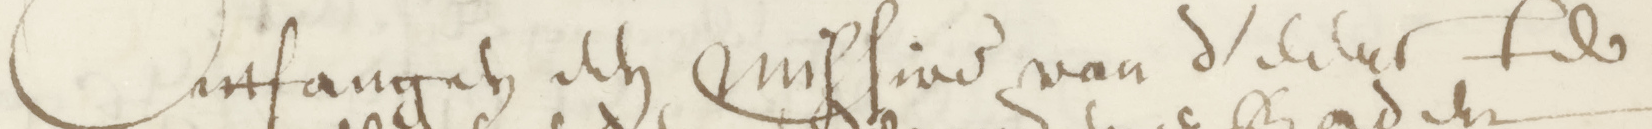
Ontfangen een Missive van d‛eerste
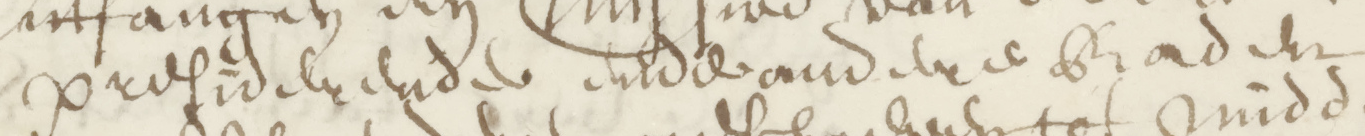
presiderende ende andere Raden
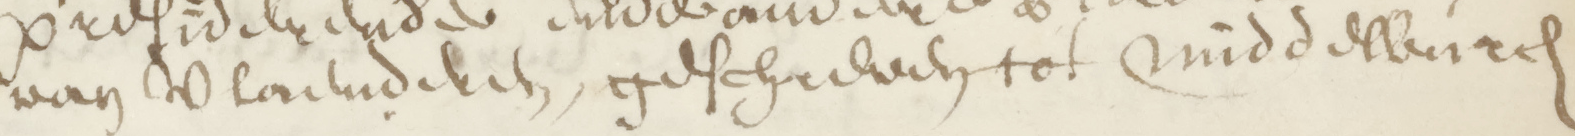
van Vlaenderen, geschreven tot Middelburch
